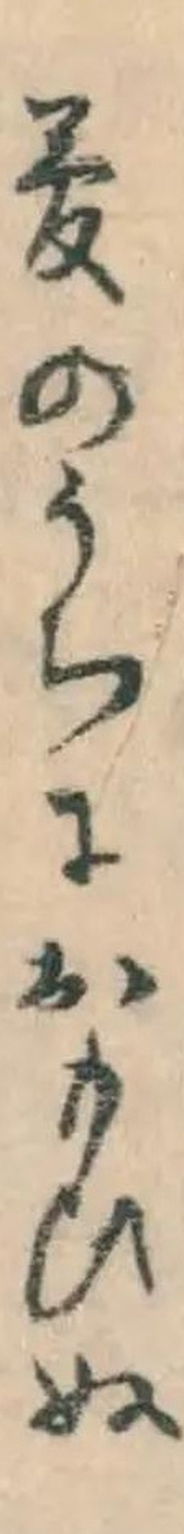夢のうちにおもひぬ
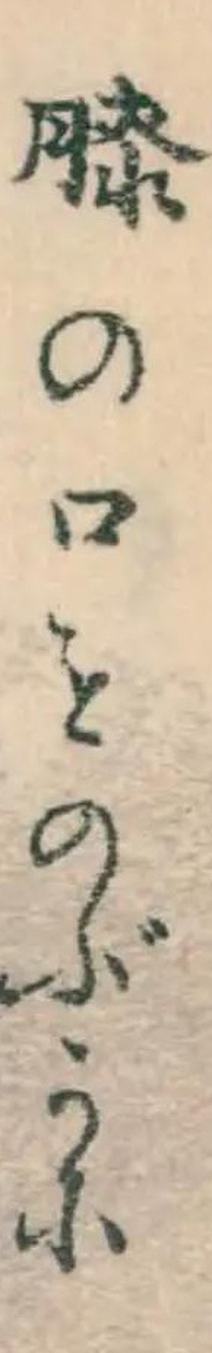膝の口をのぶかに
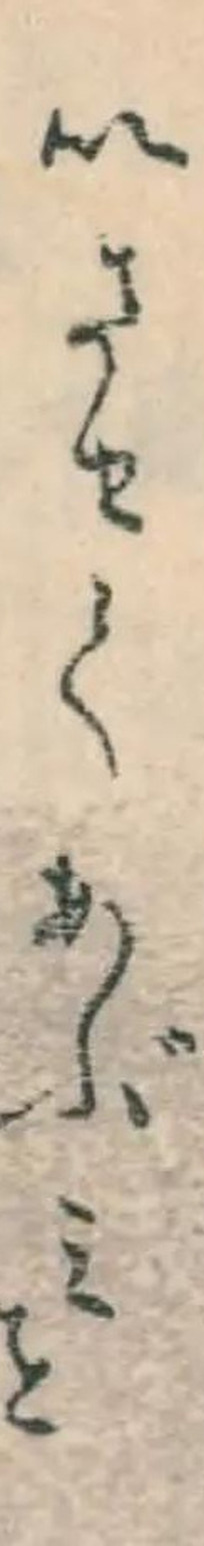いさせてあぶみを
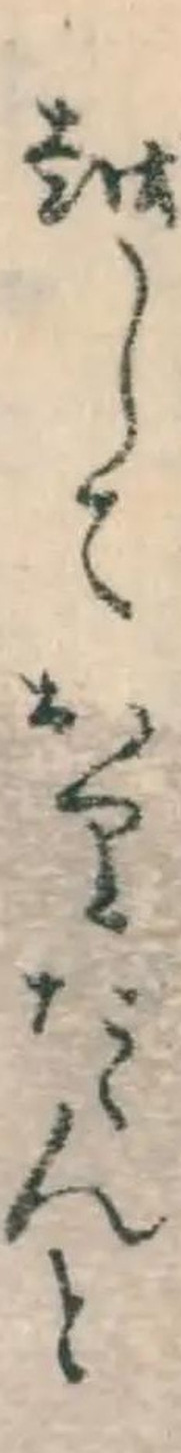越しておりたゝんと
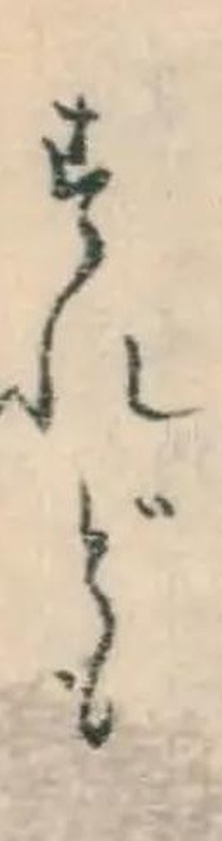すれども
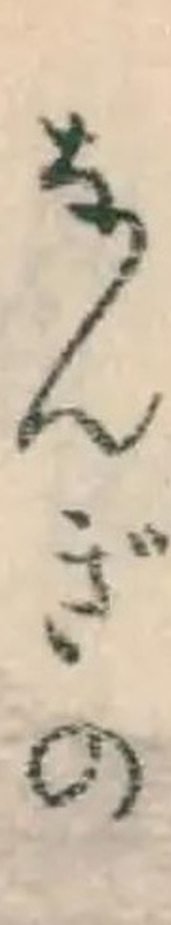なんぎの
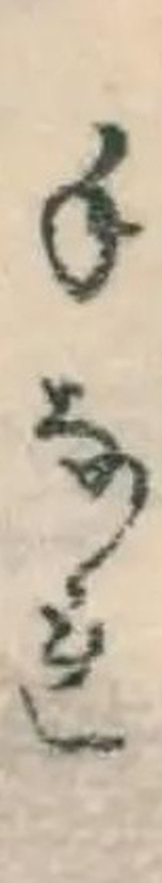手なれ
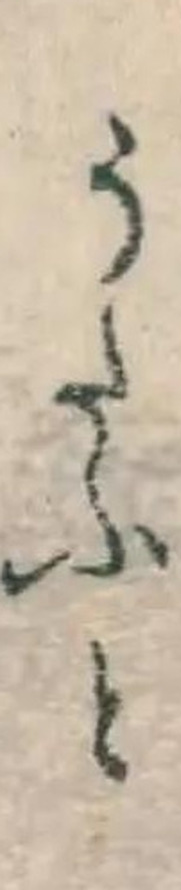うたふと
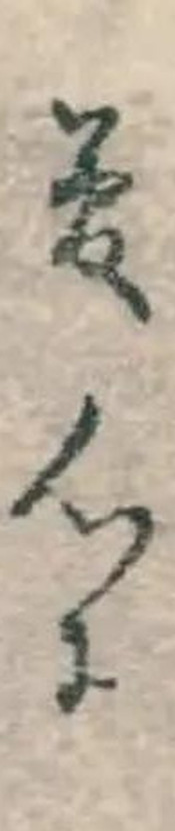夢心に
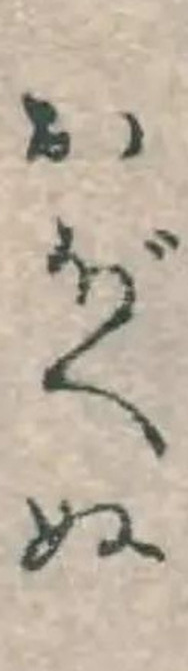おぼへぬ

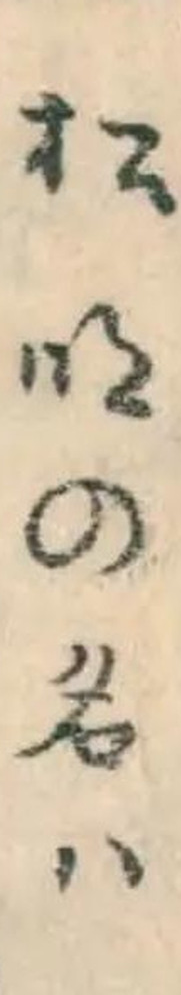松明の名は
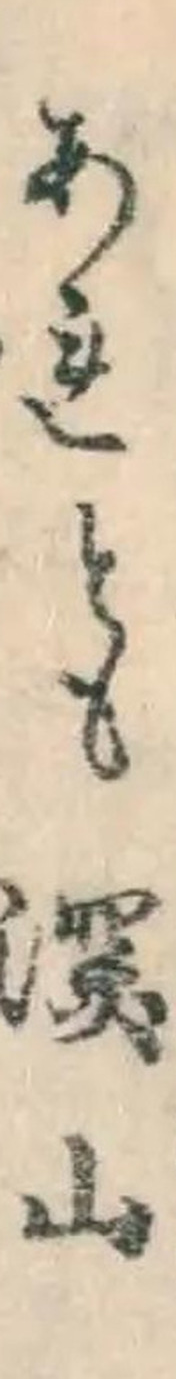あれとも深山
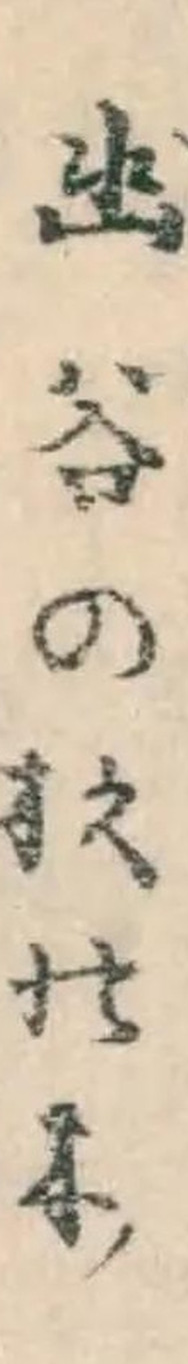幽谷の杦の木
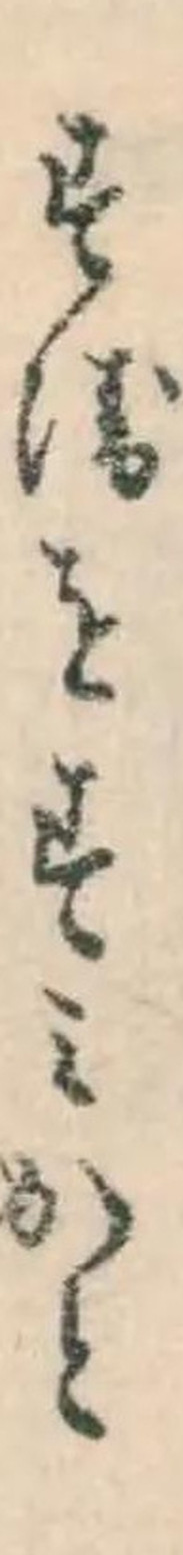すゑをすみかと
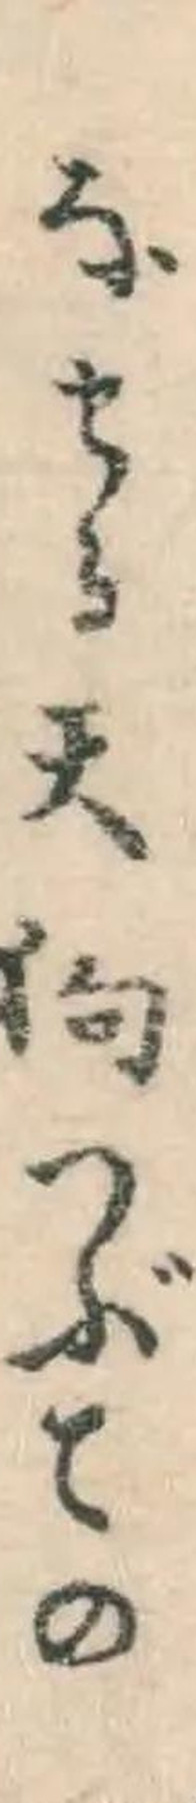なせる天狗つぶての
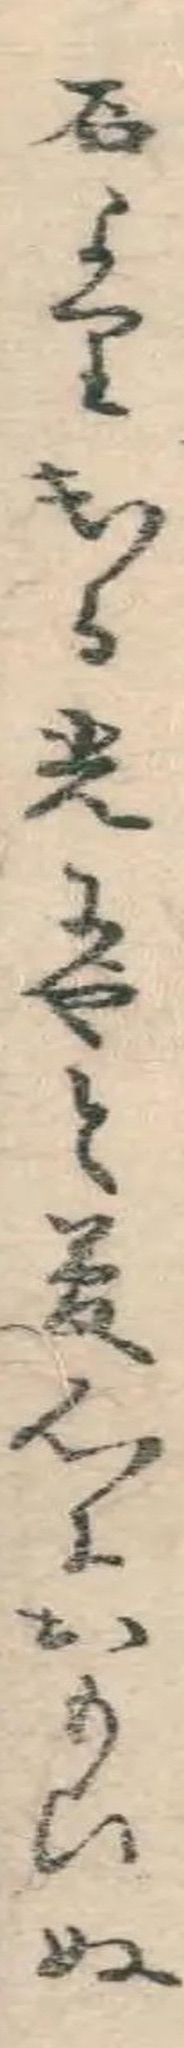石より出る光にやと夢心におもひぬ
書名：百鬼徒然袋 3巻. [2]
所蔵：国立国会図書館 National Diet Library, JAPAN
